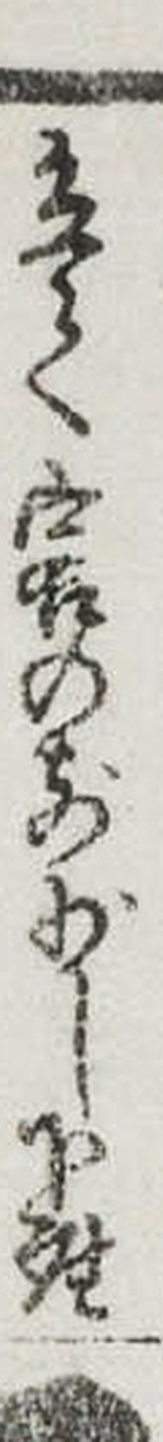立て客の前少し下座
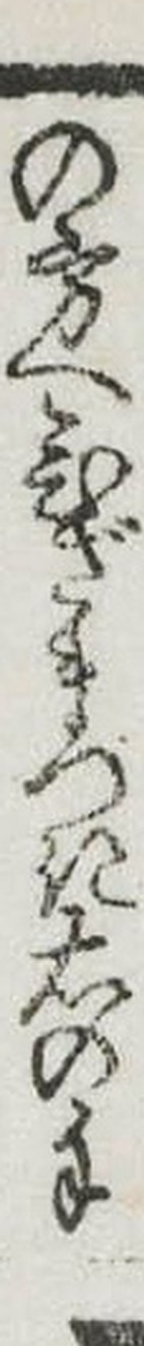の方へひざまづき右の手
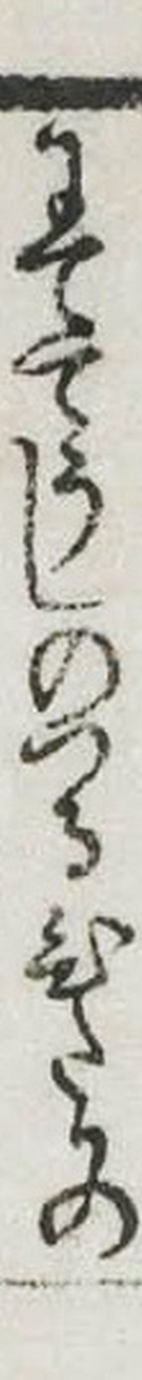にててうしのつるひたりの
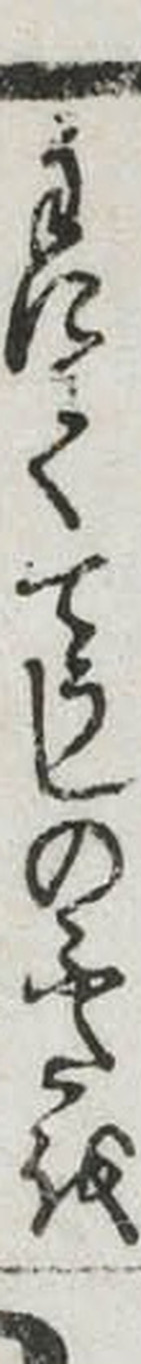手にててうしのふたを
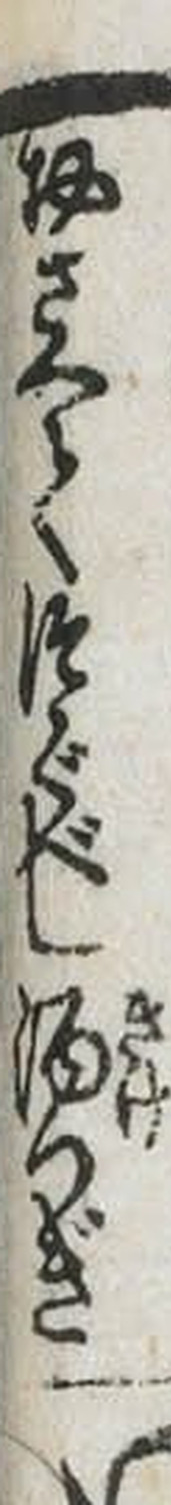おさへてつぐべし酒つぎ
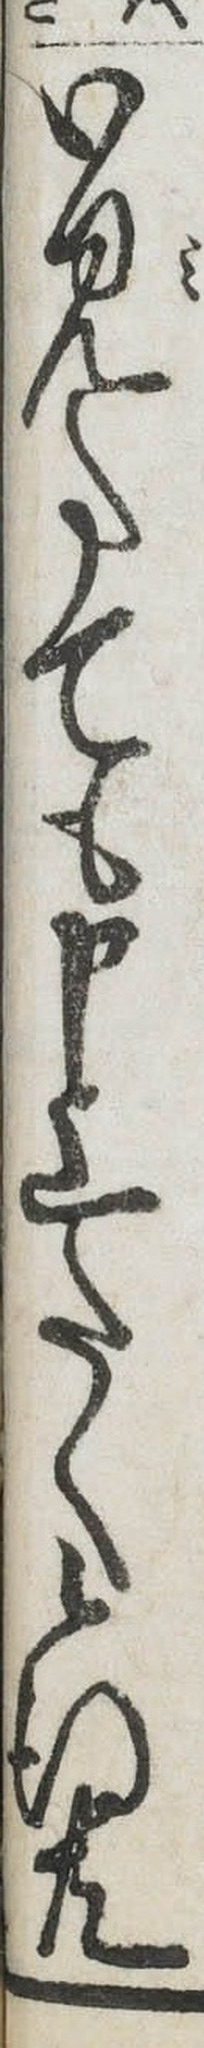御見たても申上たく候得共
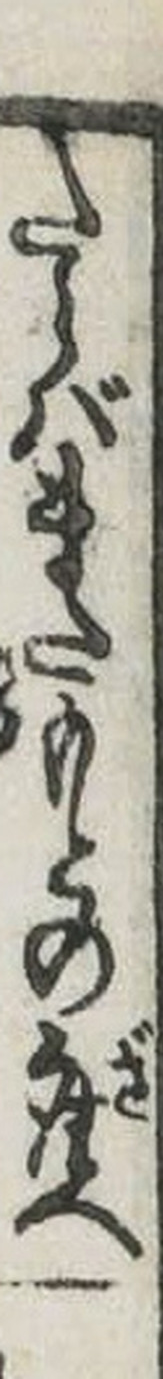たらばまたもとの座へ
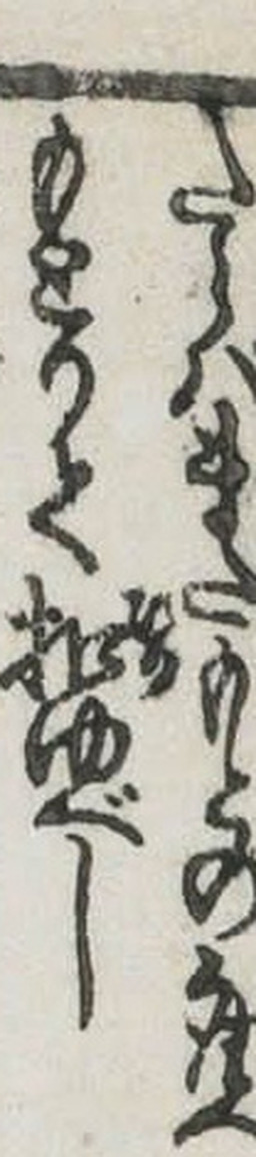もとりて扣ゆべし
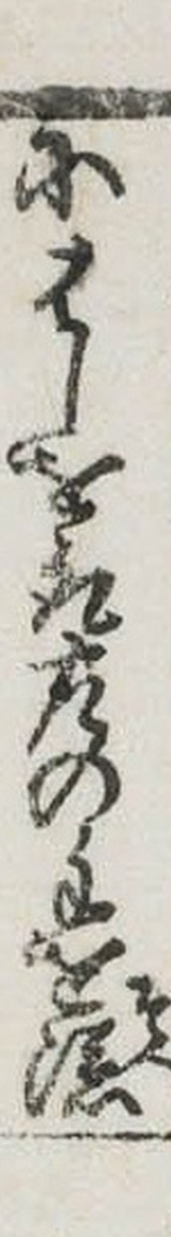にはしを取左の手を添
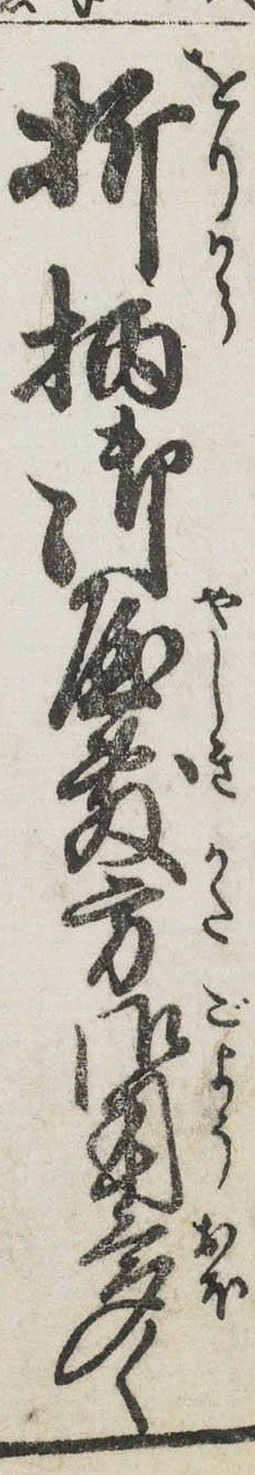折柄御屋敷方御用多く
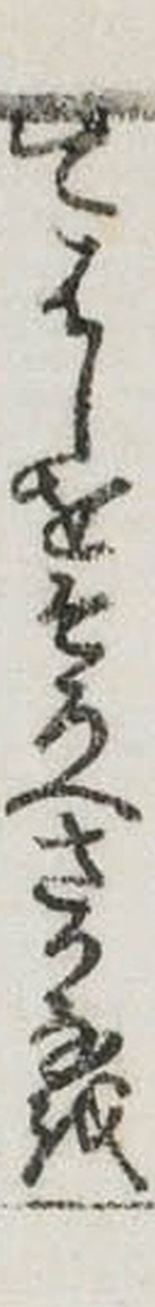てはしをそろへさかなを
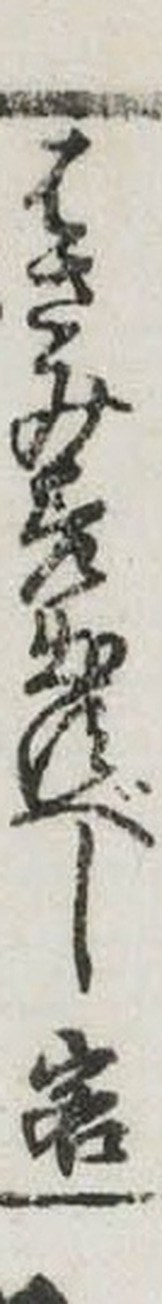はさみ差出すべし客
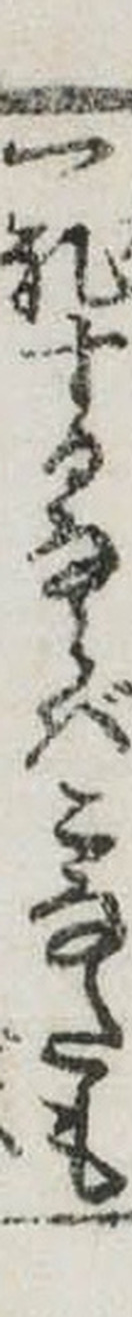一礼するならばこなたも
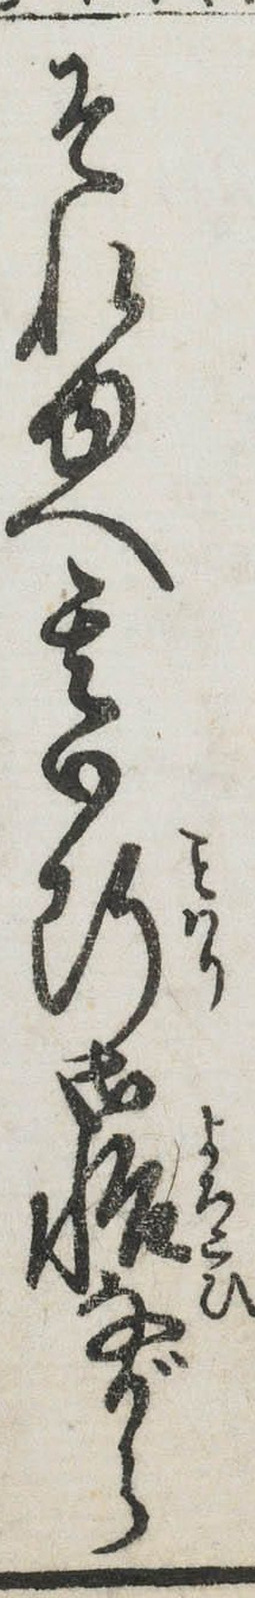それゆへ其御断御怡ながら
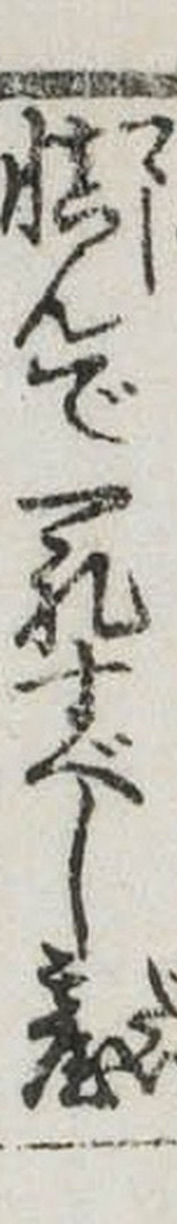慎んで一礼すべし台
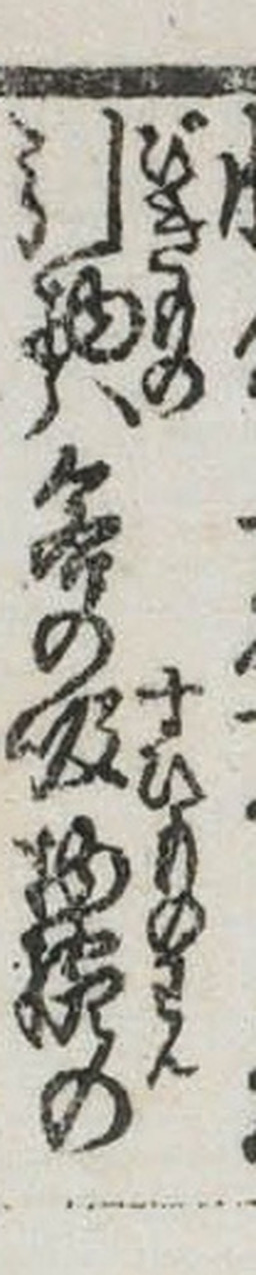引物は客の吸物椀の
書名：頭書萬用婦人手紙之文言
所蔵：東京学芸大学教育コンテンツアーカイブ
